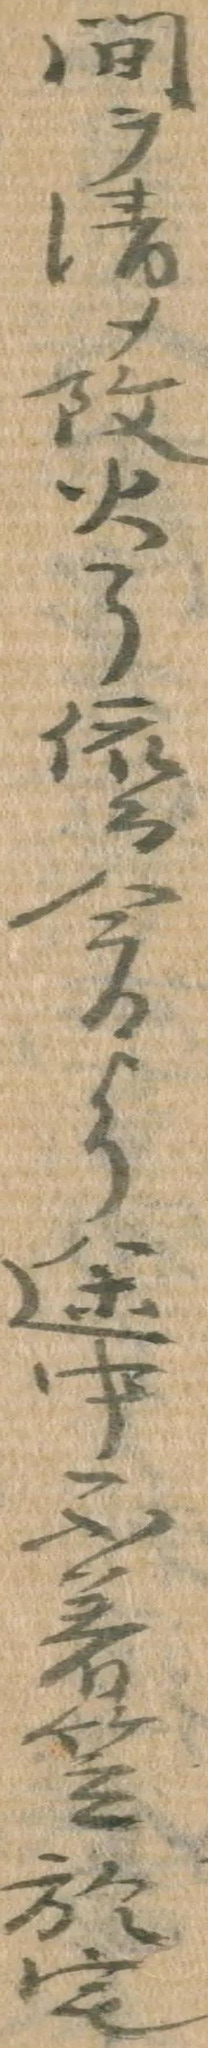間ヲ清メ改火了、依而今日より途中不着笠、於宅
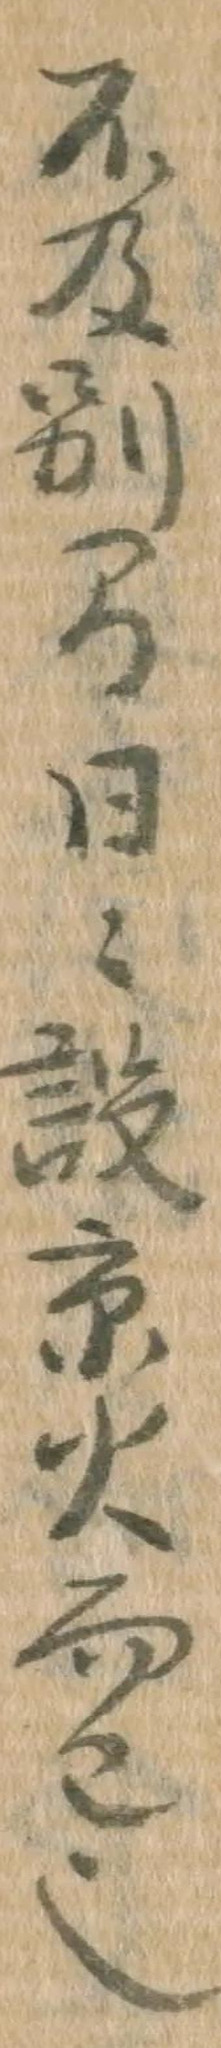不及、別間日〻設京火而已也、
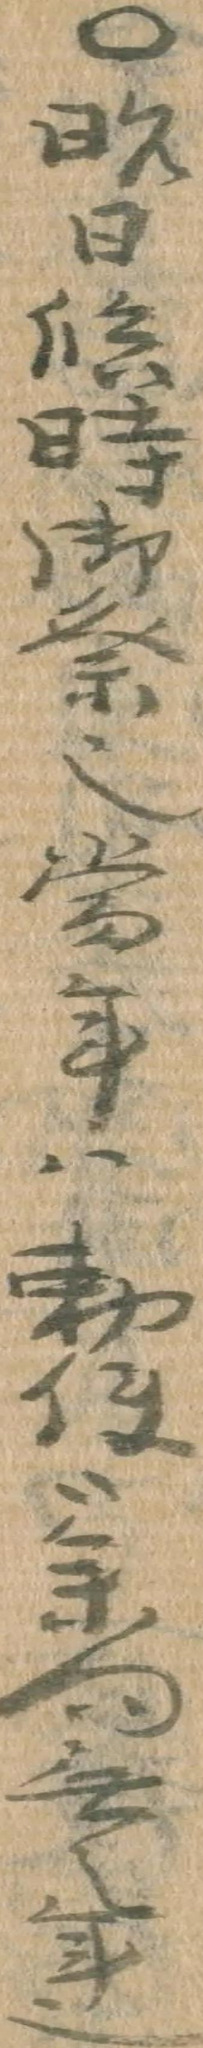○昨日臨時御祭也、當年ハ勅使御参向無之年也、
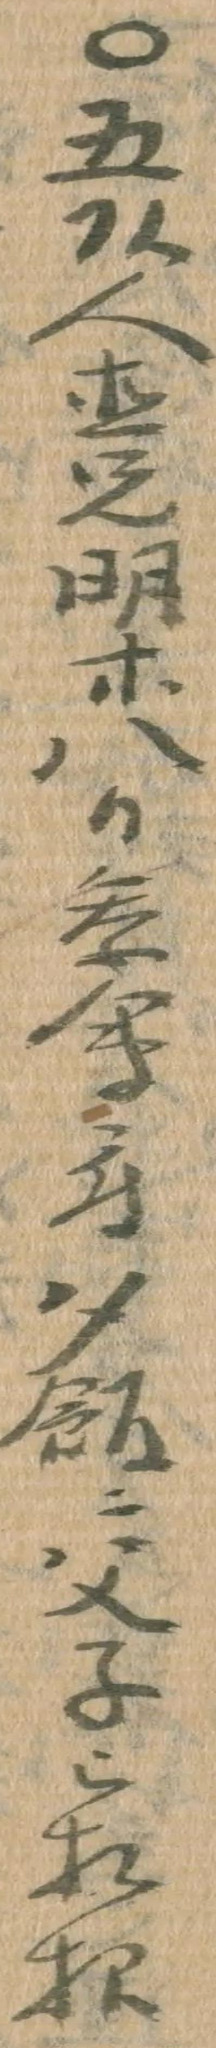○五頭人直兄、明廿八日参會ニ付、夕飯ニ父子被相招
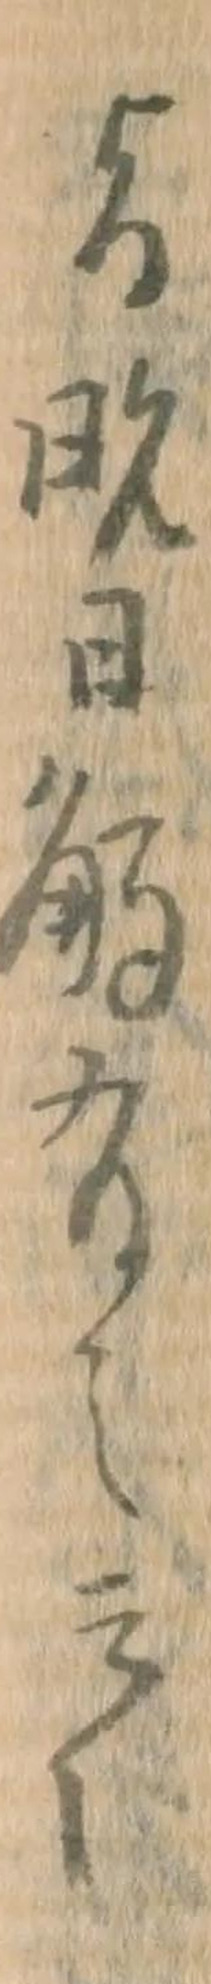旨昨日触有之云々、
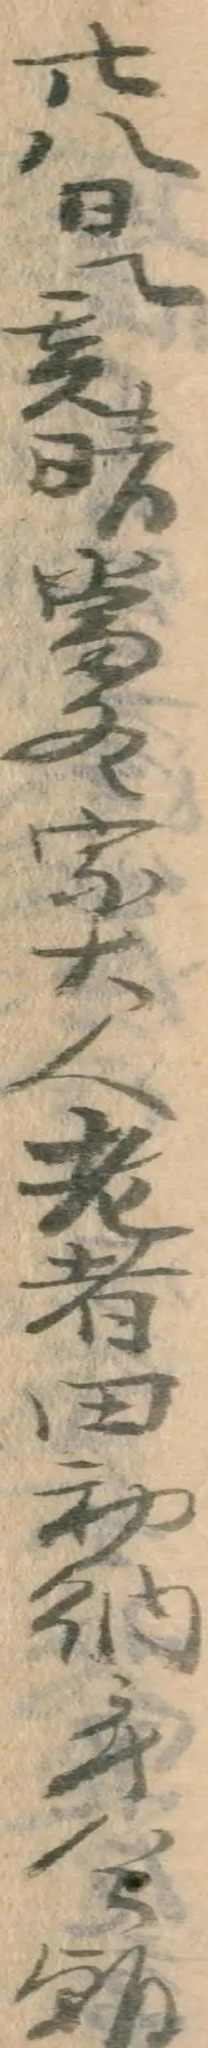廿八日乙亥晴、當冬家大人老者田初納ニ付、今朝
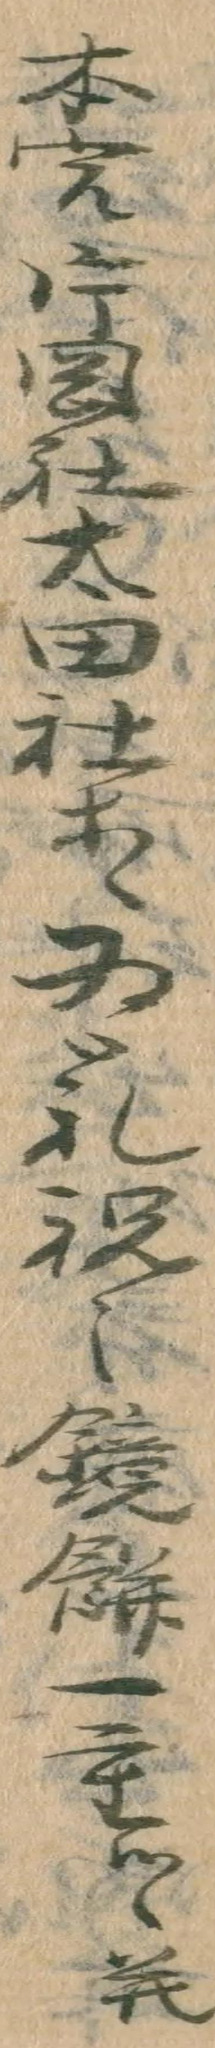本宮・片岡社・太田社等へ為御礼祝之鏡餅一重ツゝ并
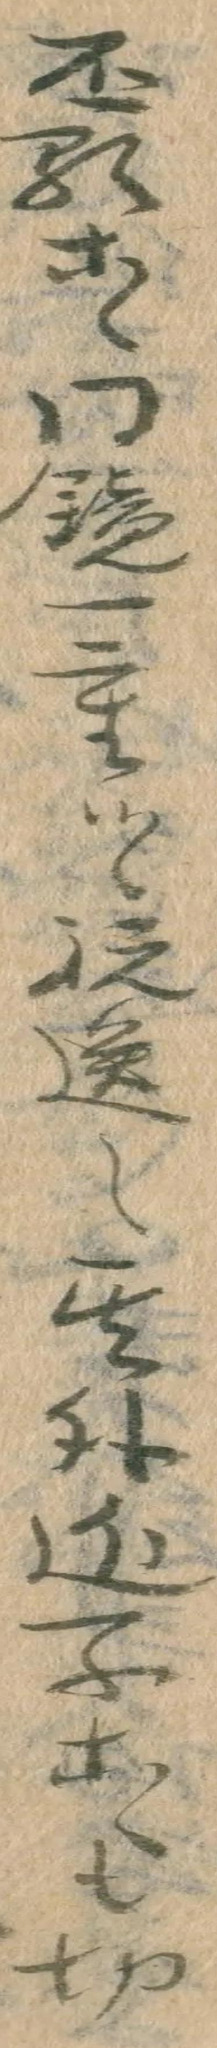丕顕等候、同鏡一重ツゝ祝送之、其外近所等へも切
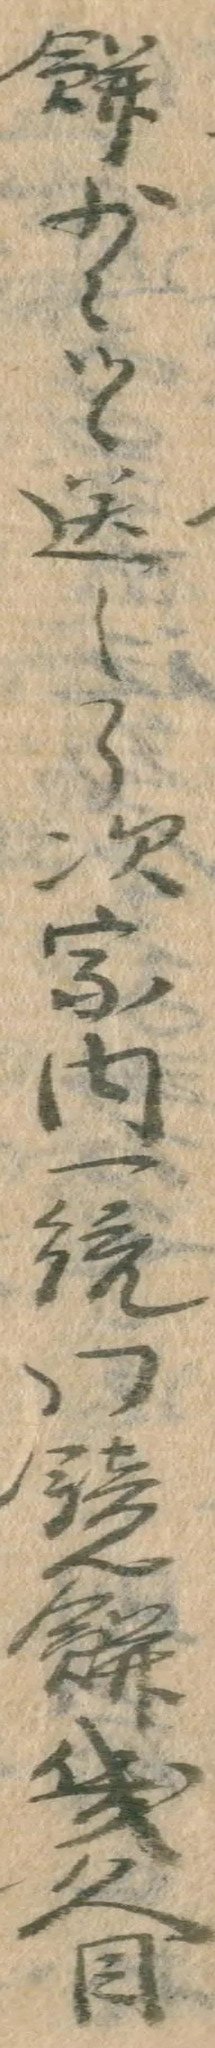餅少々ツヽ送し了、次家内一統同覧餅幾久目
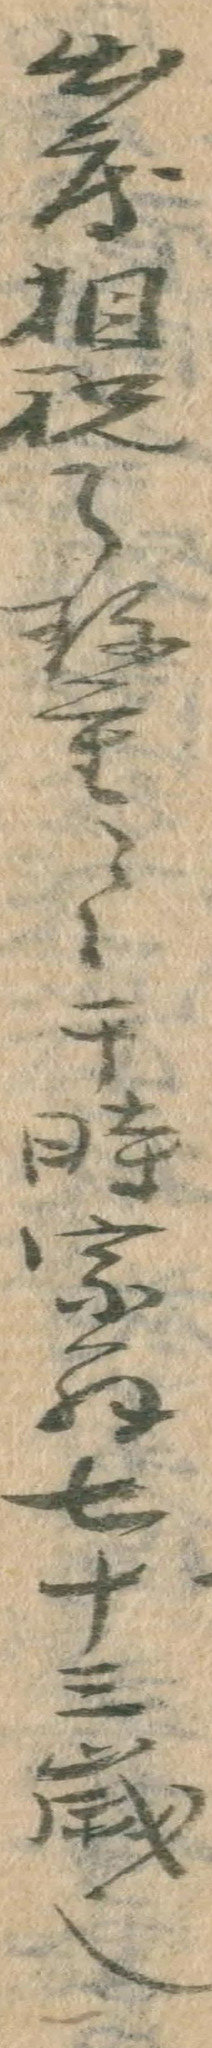出度相祝了、珍重〻〻、于時家翁七十三歳也、
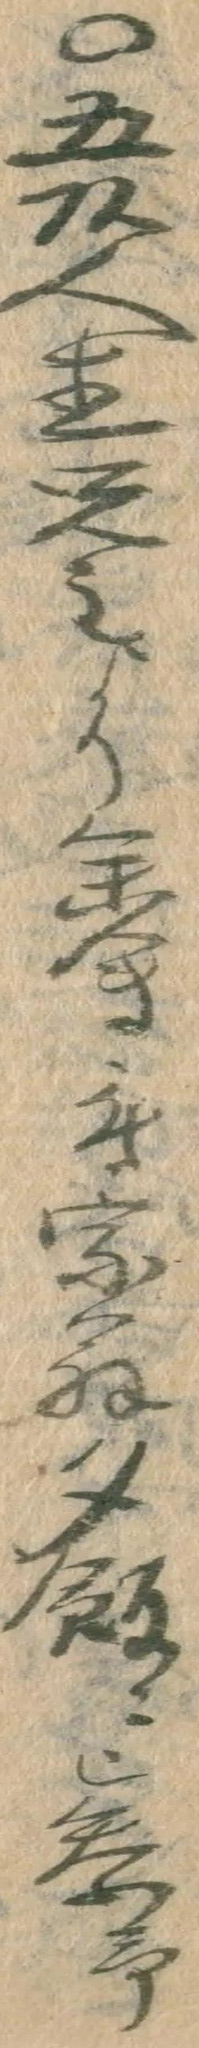○五頭人直兄、之より参會ニ付、家翁夕飯に被参、予
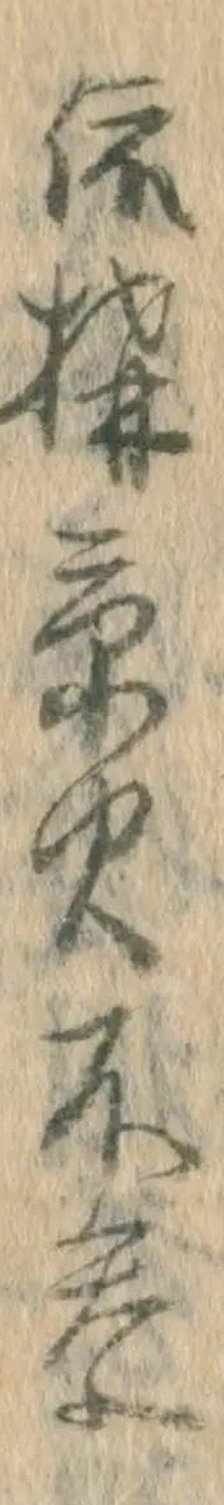依構京火不参、
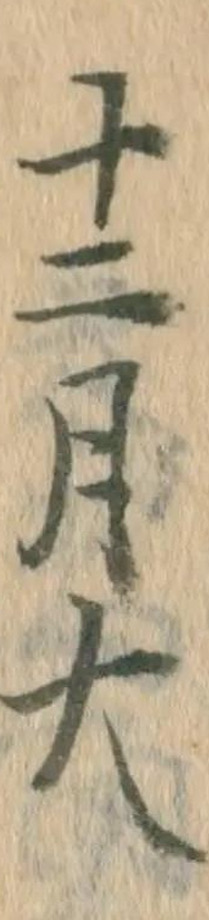十二月大
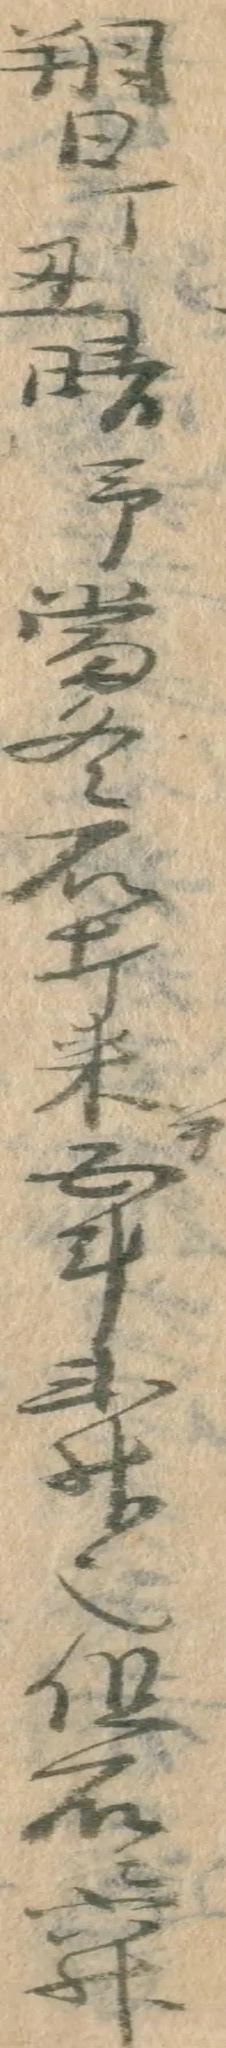朔日丁丑晴、予當冬石打米判五斗弐升也、但石ニ六升
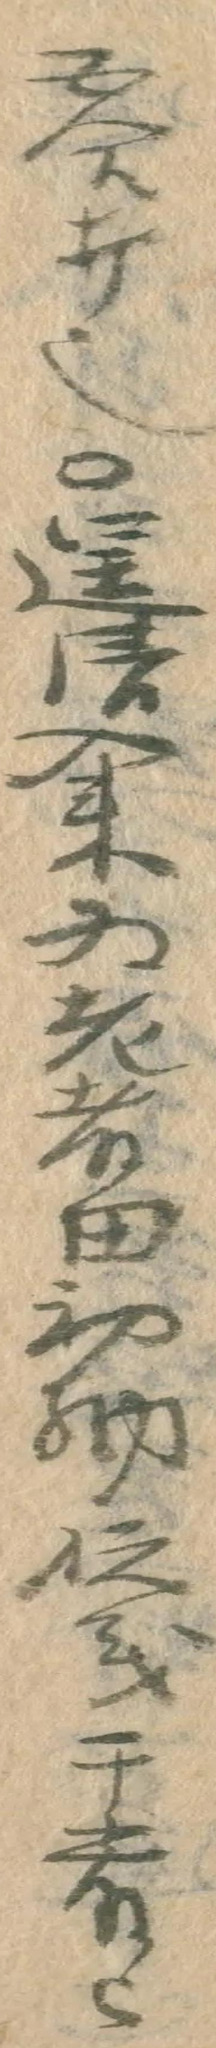五合打也、○逞清入来、為老者田初納祝義、干肴被

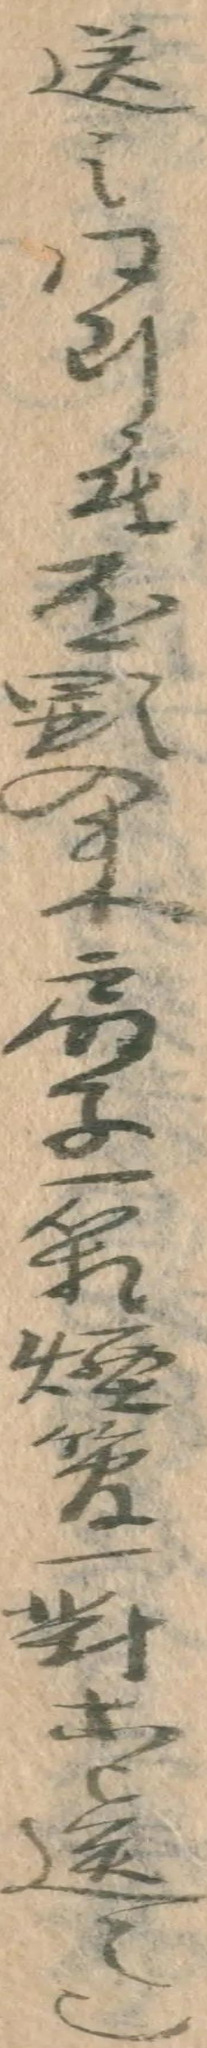送之同断ニ付、丕顧入来、扇子一箱・煙管一対等被送之也、
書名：賀茂社記録. 第63冊
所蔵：国立国会図書館 National Diet Library, JAPAN
